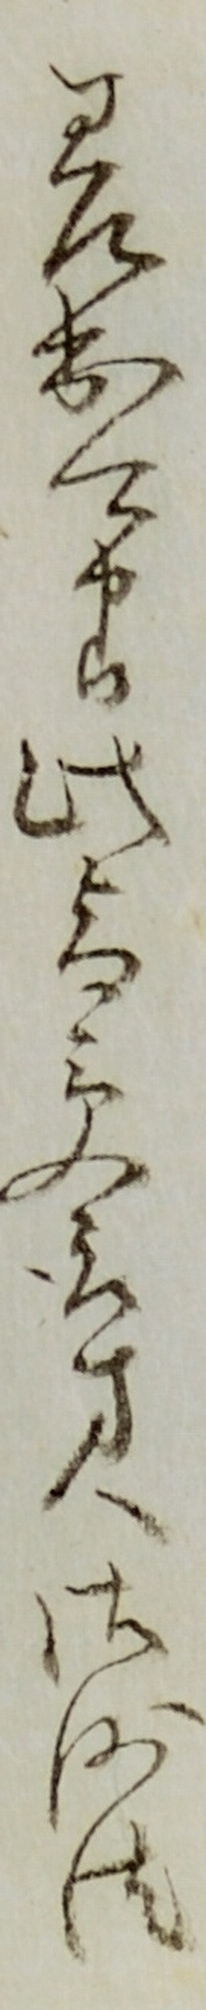差出可申候此旨受取方へ御沙汰

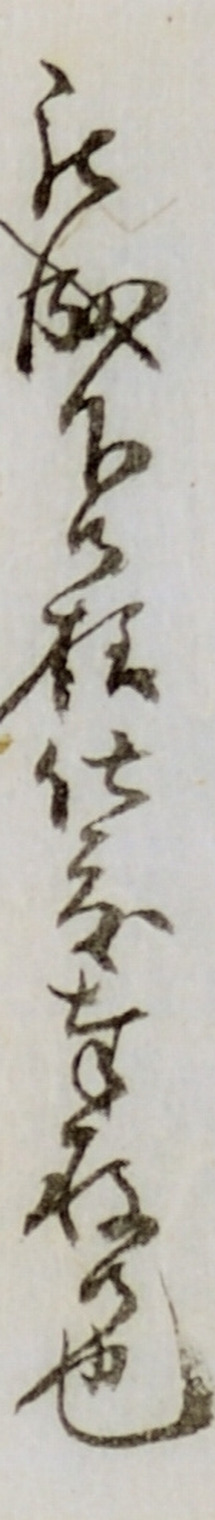被成下候様仕度奉存候也
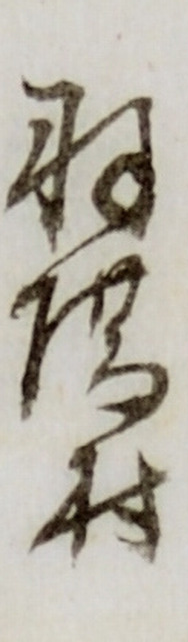羽場村
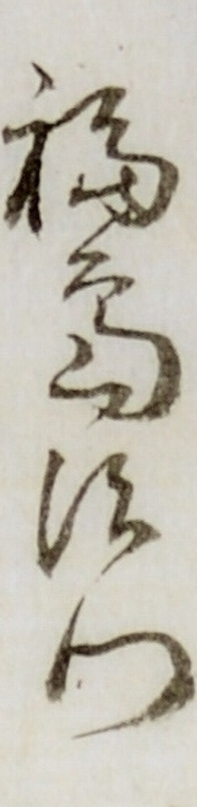福島治門
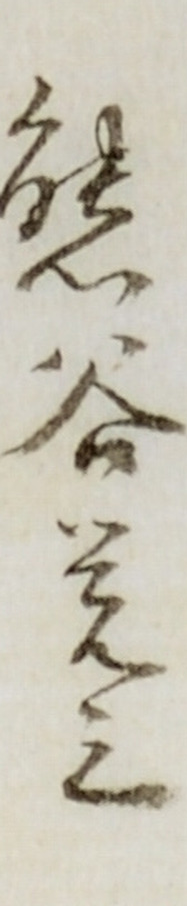熊谷覚三
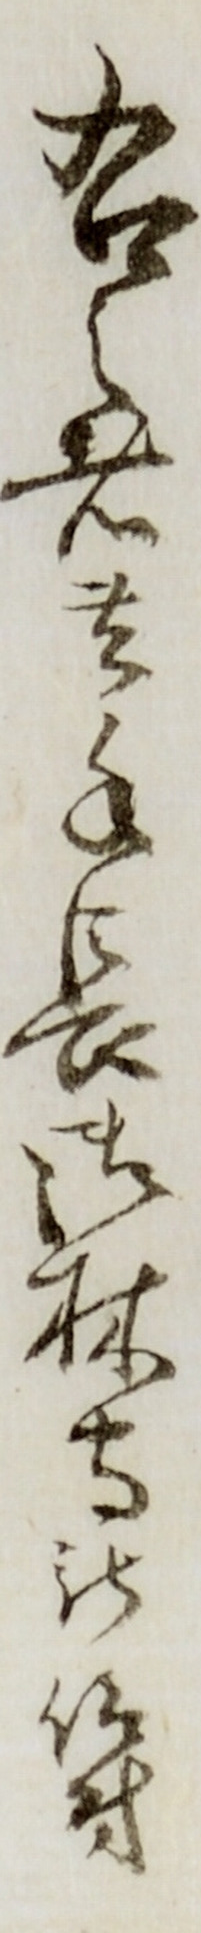右之者共年長御林守被仰付
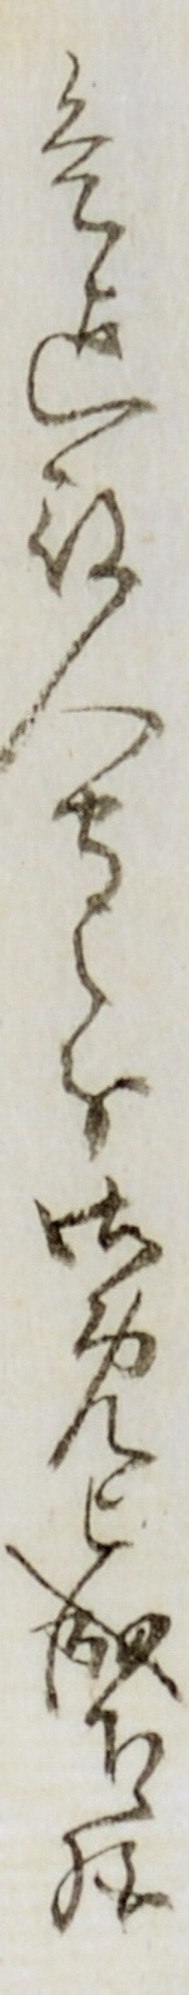是迄役人守之分御免被成下候様
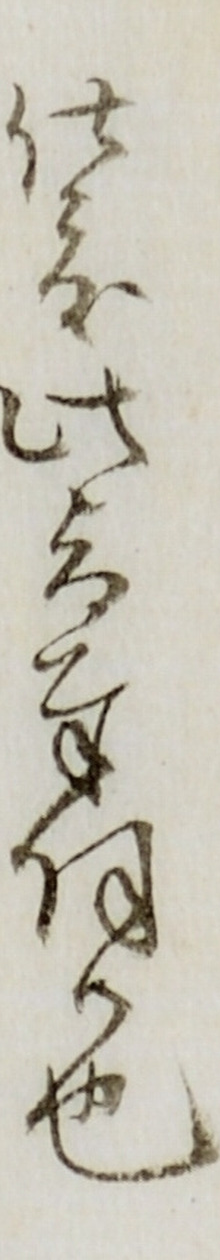仕度此旨奉伺候也
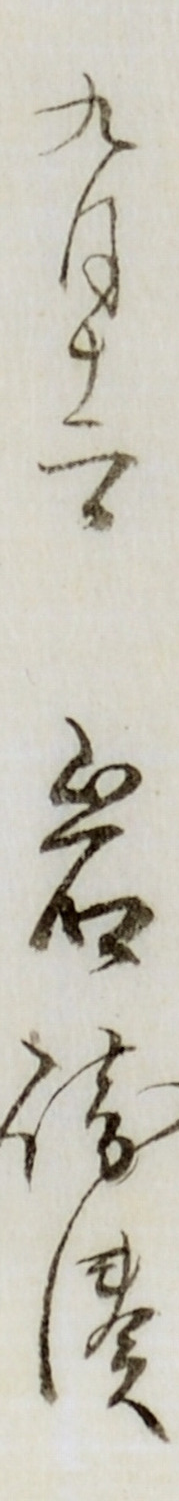九月十二日岩崎湊
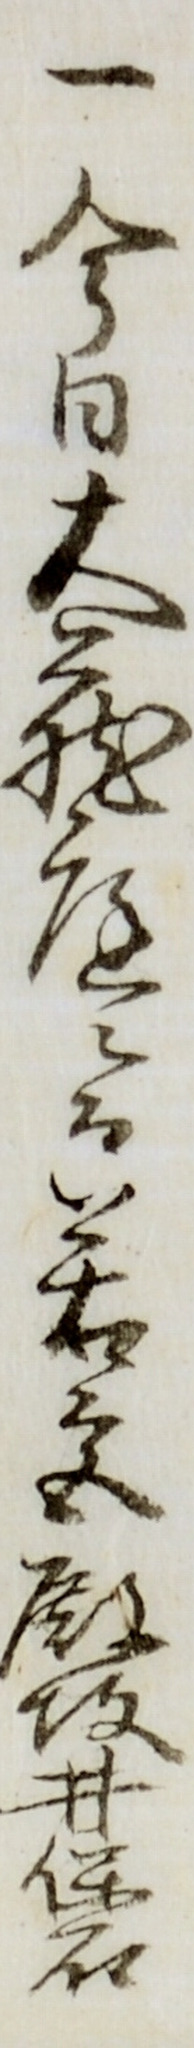一今日大蔵庭にて若宮殿坂井保石
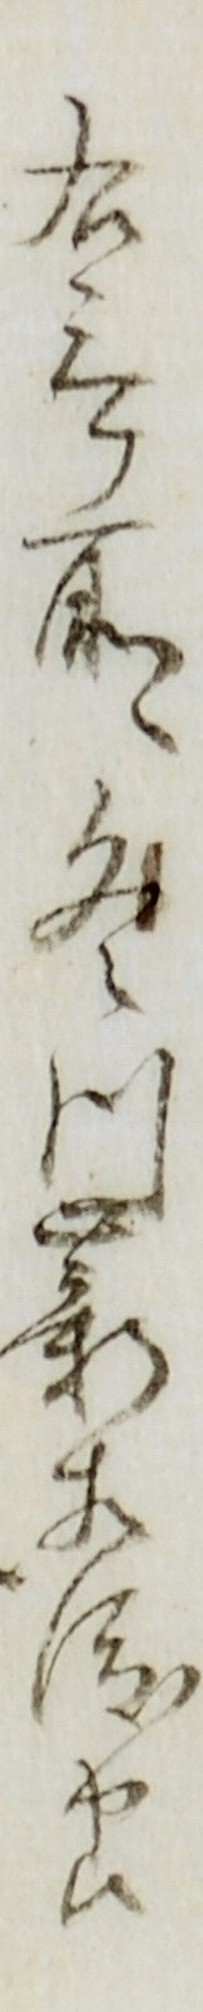右三ヶ所へ冬川薪相渡申候
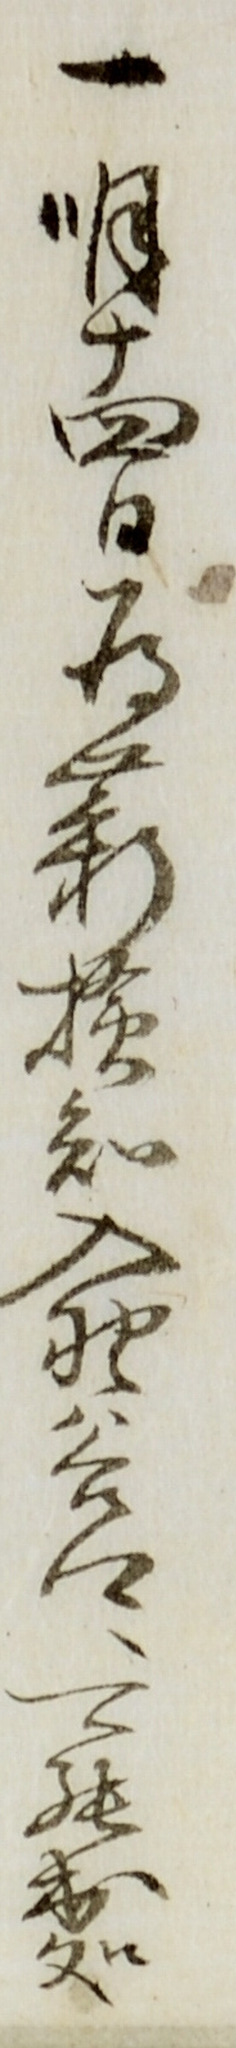一明十四日為薪検知入野谷郷へ可罷出処
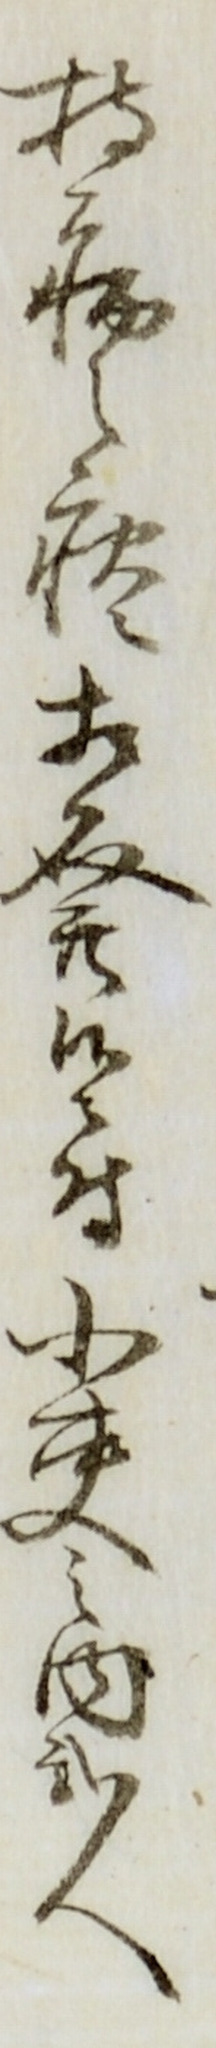持病之痰相発候に付小吏之内弐人
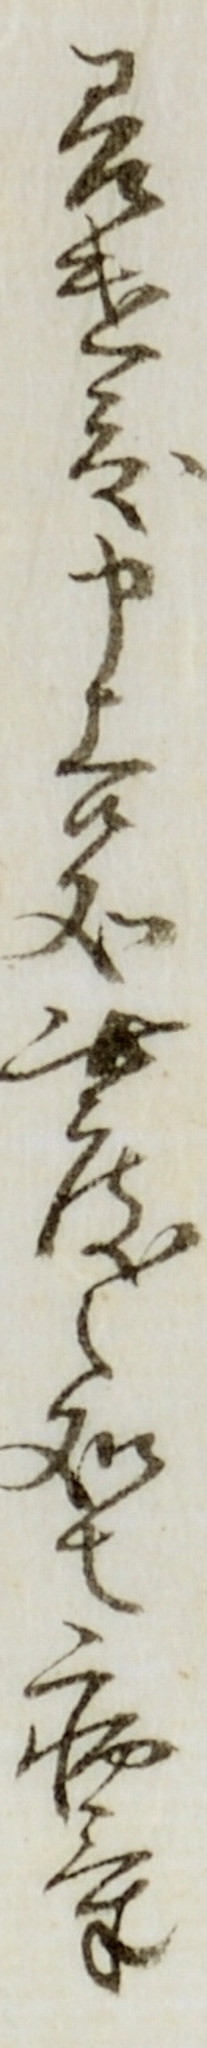差遣度申上候処此度之処は病気
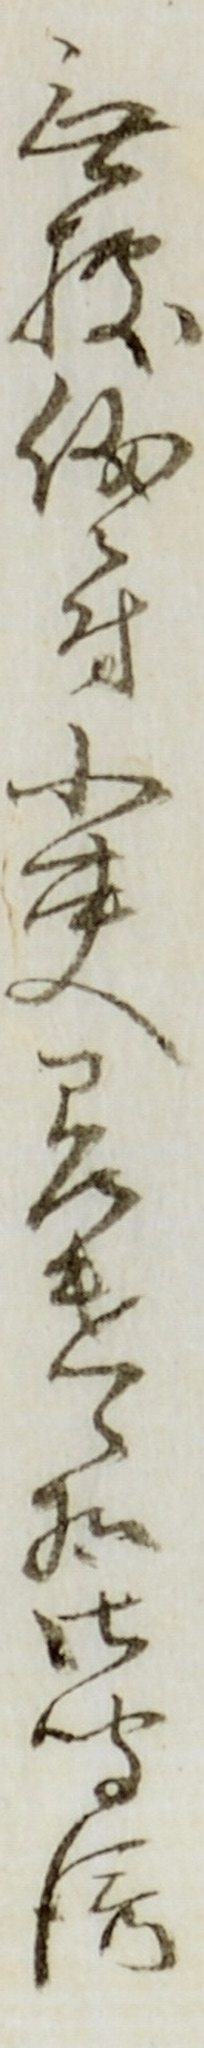無拠儀に付小吏差遣候様御聞済
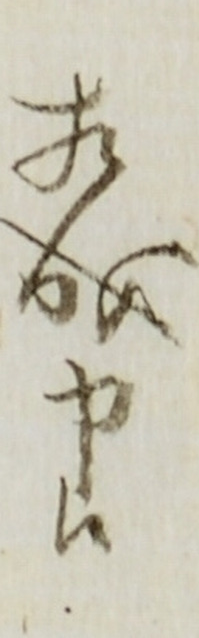相成申候
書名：山林方諸事御用留
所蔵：伊那市立高遠町図書館・合同会社AMANE
